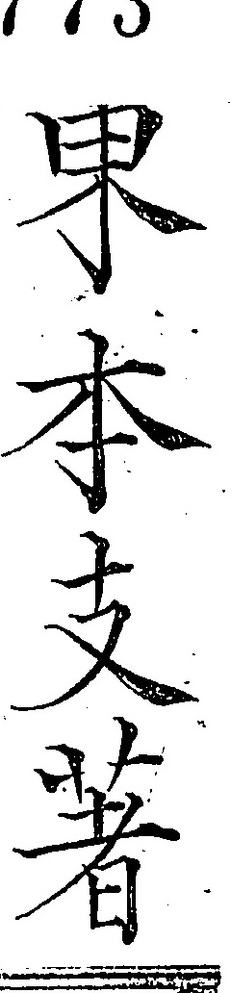伊東本支著

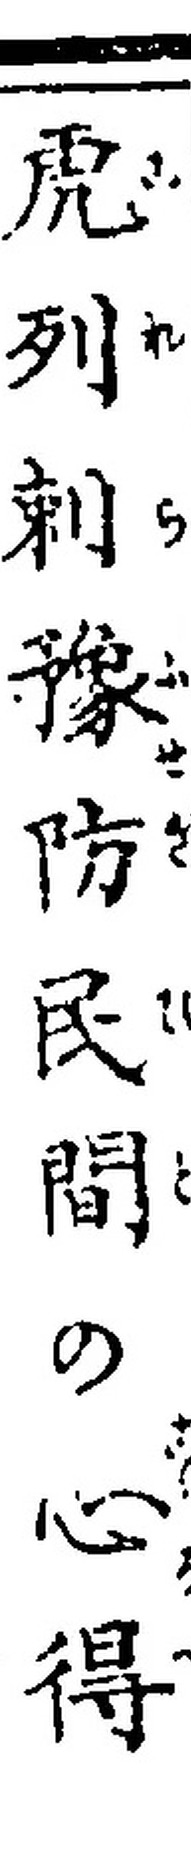虎列刺豫防民間の心得
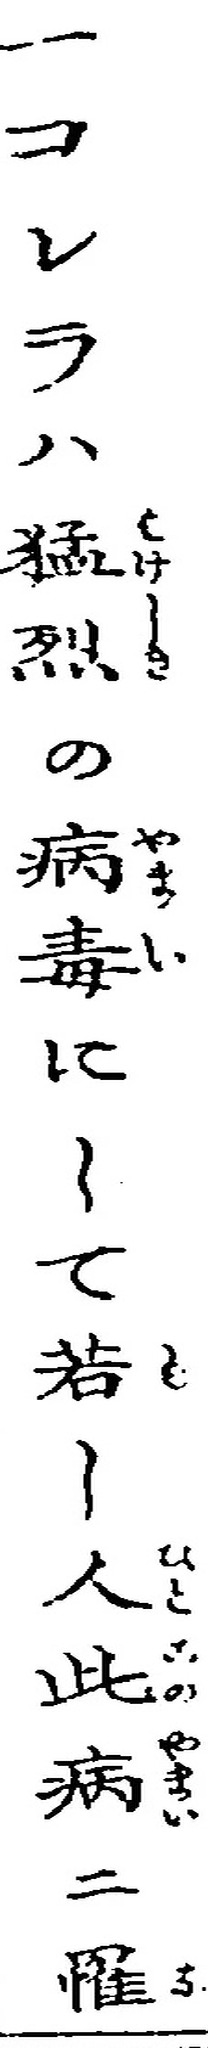一コレラは猛烈の病毒にして若し人此病に罹
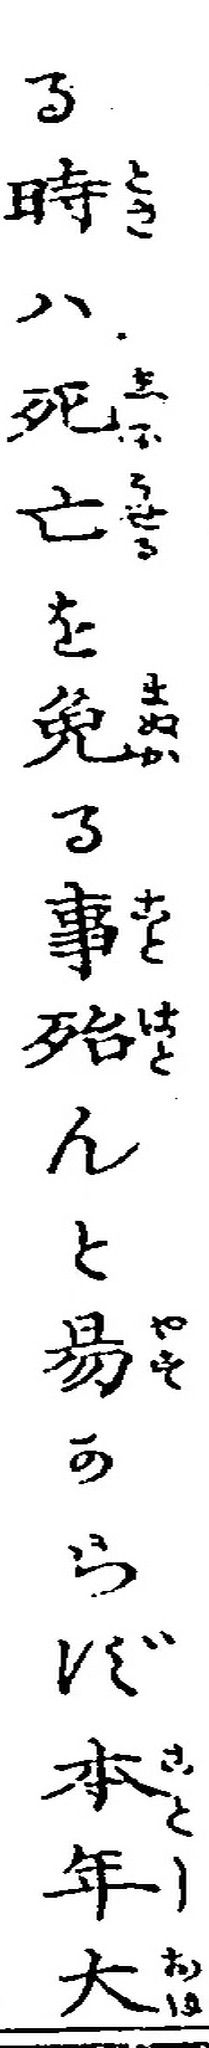る時は死亡を免る事殆んと易からず本年大
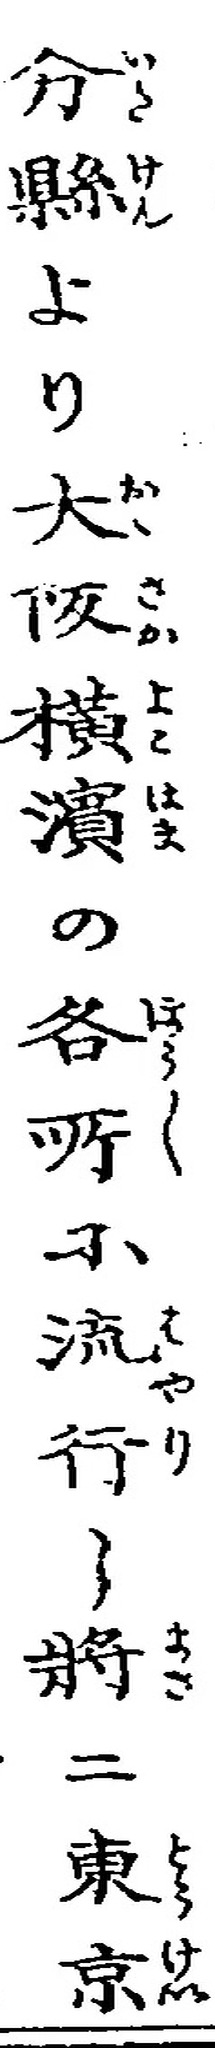分縣より大坂横濱の各所に流行し将に東京
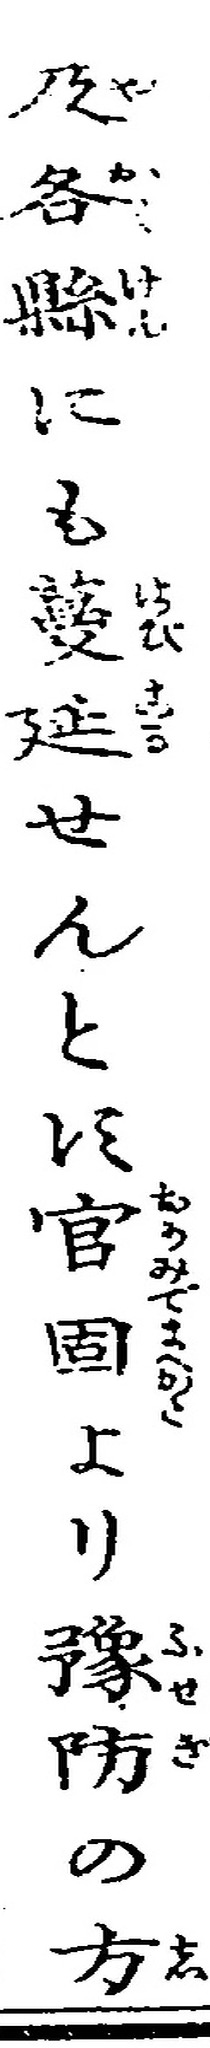及各縣にも蔓延せんとす官固より豫防の方
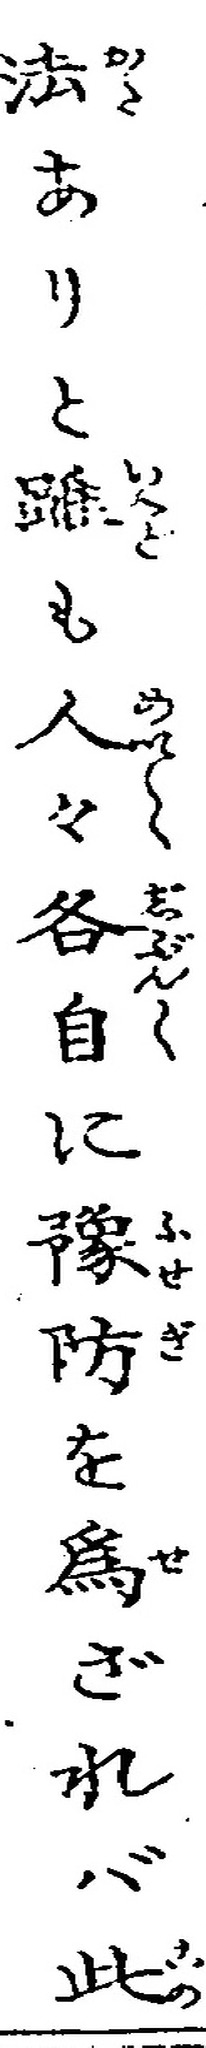法ありと雖も人々各自に豫防を為ざれば此
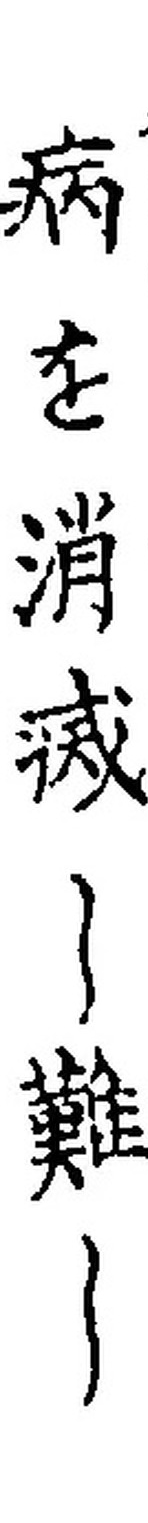病を消滅し難し
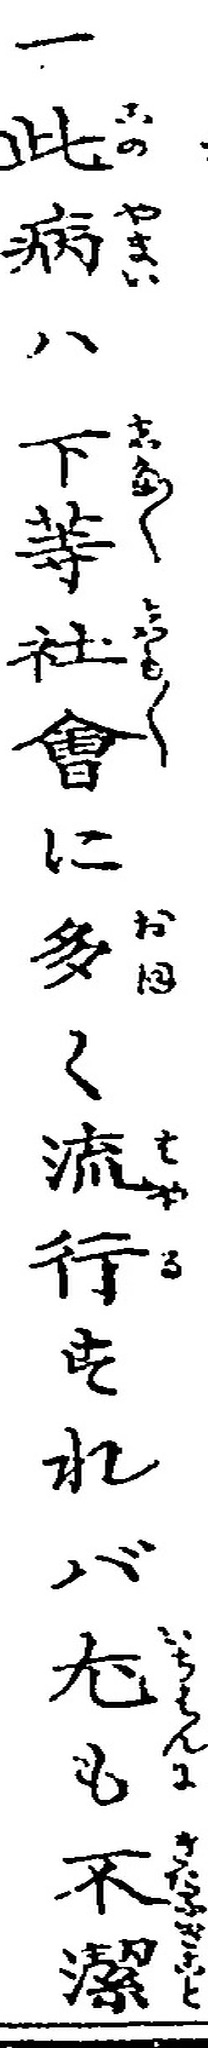一此病は下等社會に多く流行すれば尤も不潔
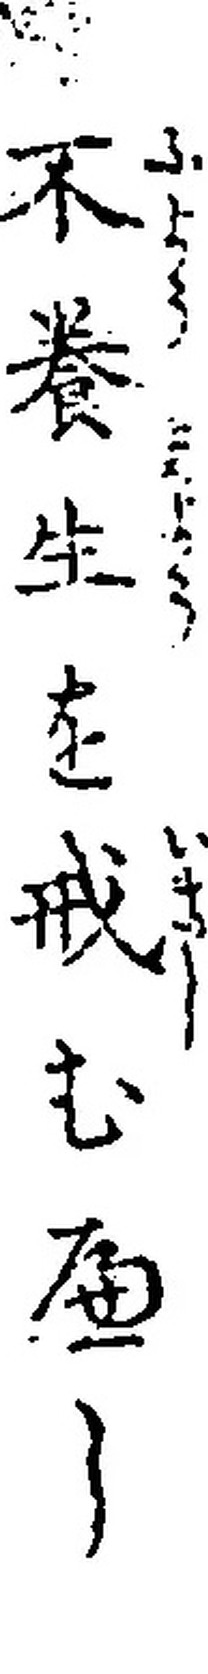不養生を戒むべし

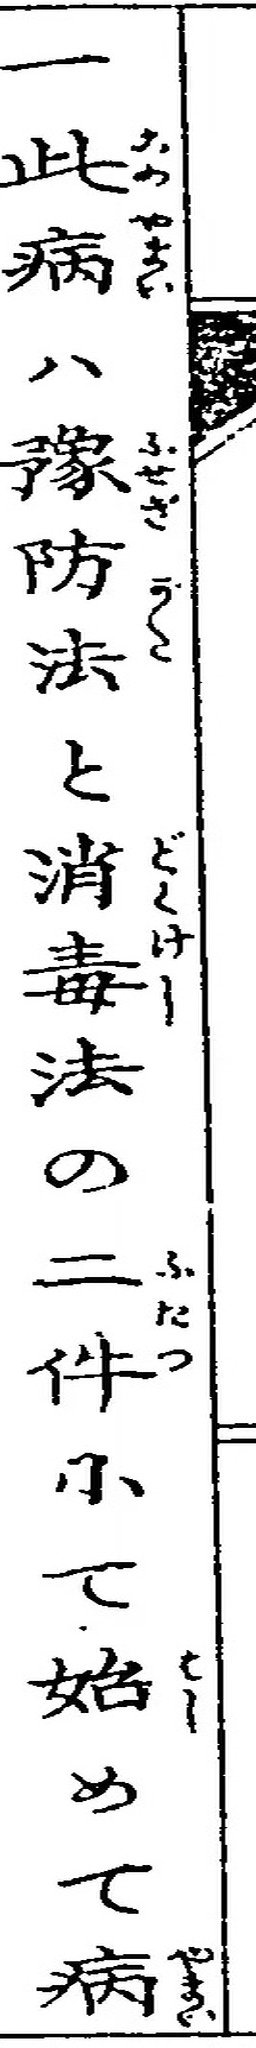一此病は豫防法と消毒法ｎ二件にて始めて病
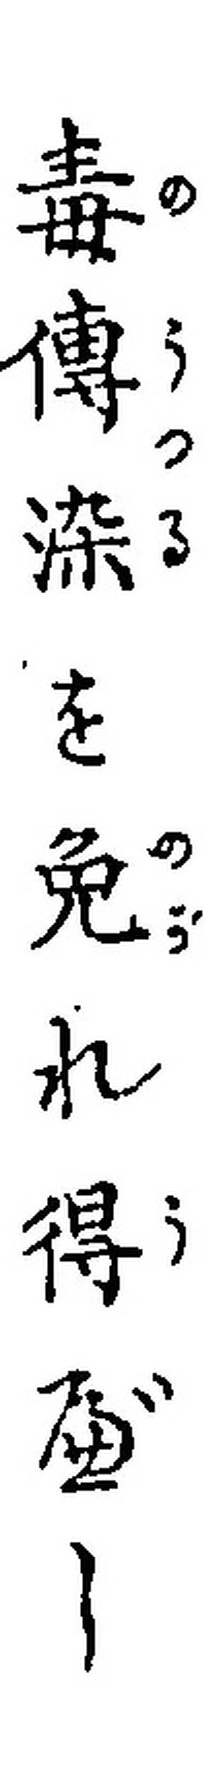毒傳染を免れ得べし
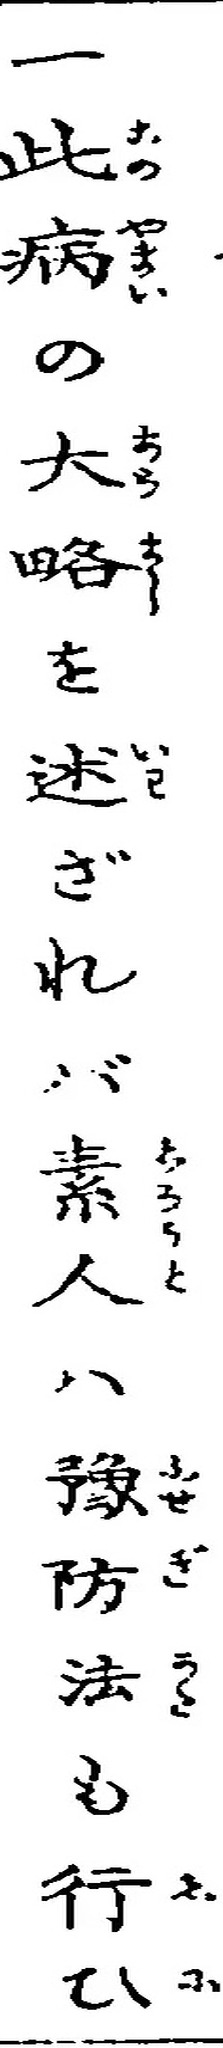一此病の大略を述ざれば素人は豫防法も行ひ
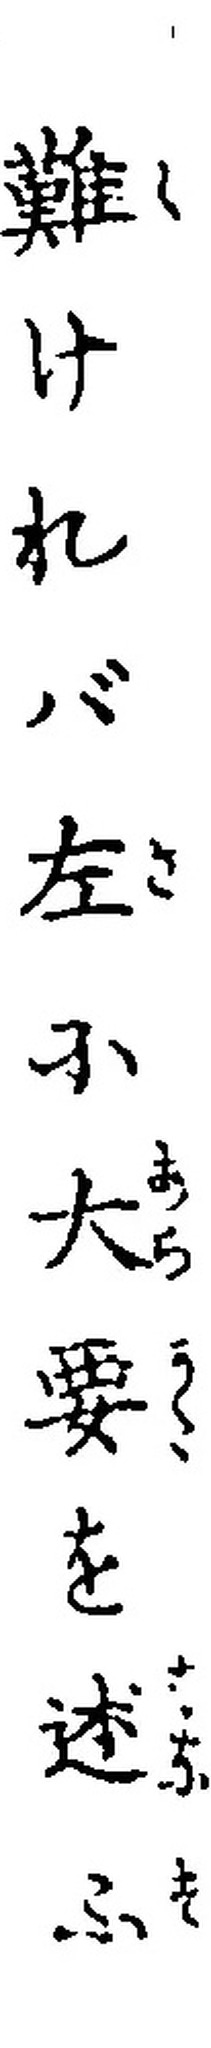難ければ左に大要を述ふ
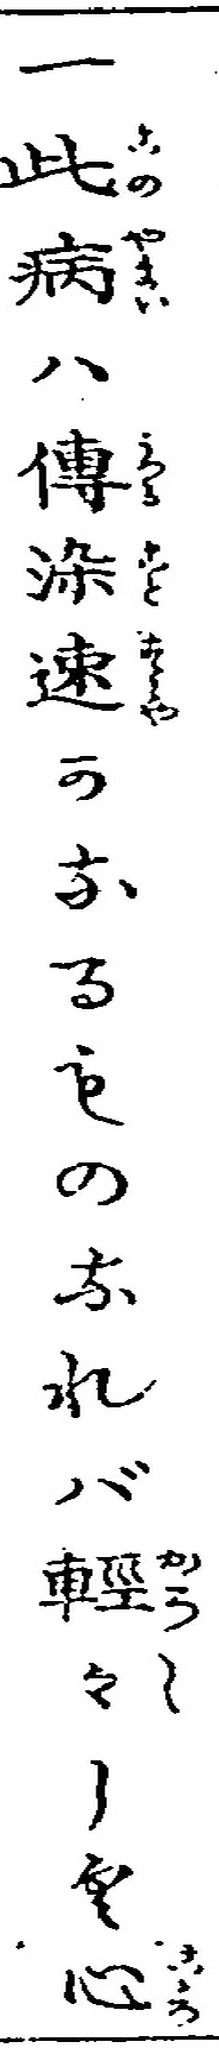一此病は傳染速かなるものなれば輕々しく心
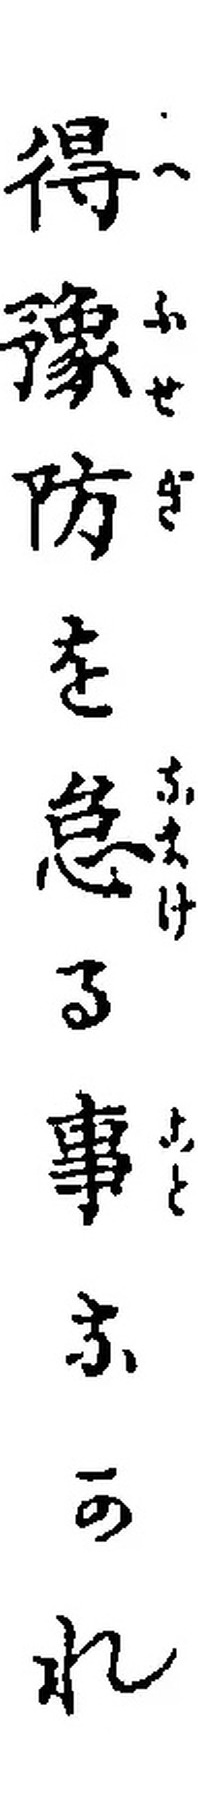得豫防を怠る事なかれ
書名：虎列剌予防民間の心得
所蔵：国立国会図書館 National Diet Library, JAPAN
